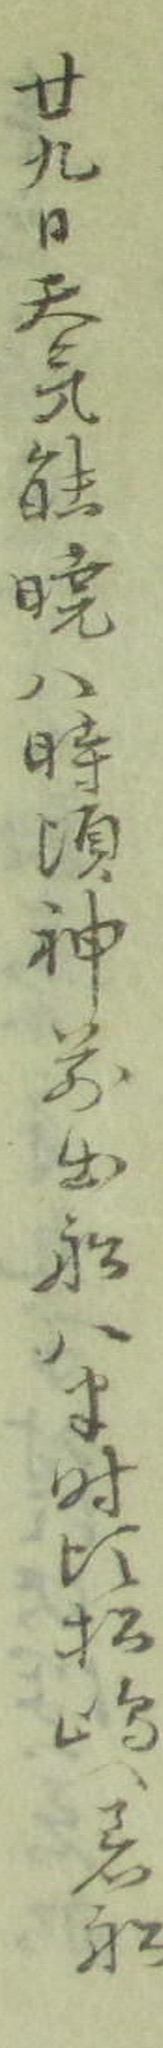廿九日天気能暁八時頃神前出船八半時頃松嶋へ着船
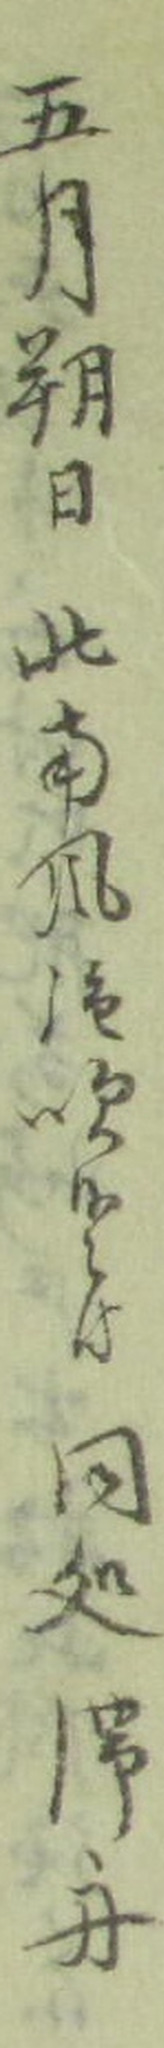五月朔日此南風強吹候に付同処滞舟
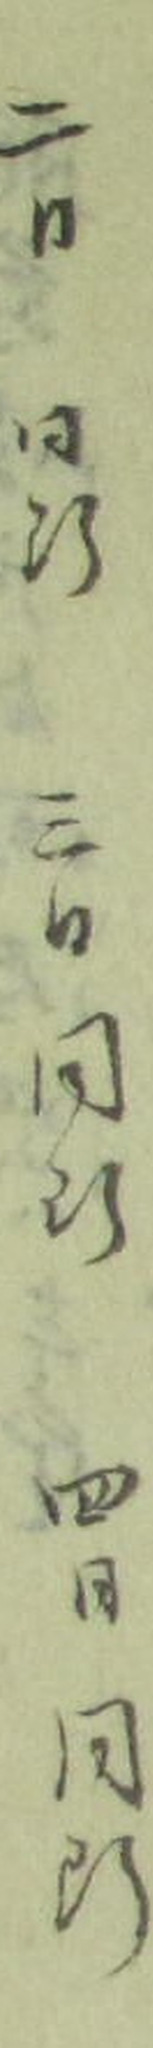二日同断三日同断四日同断
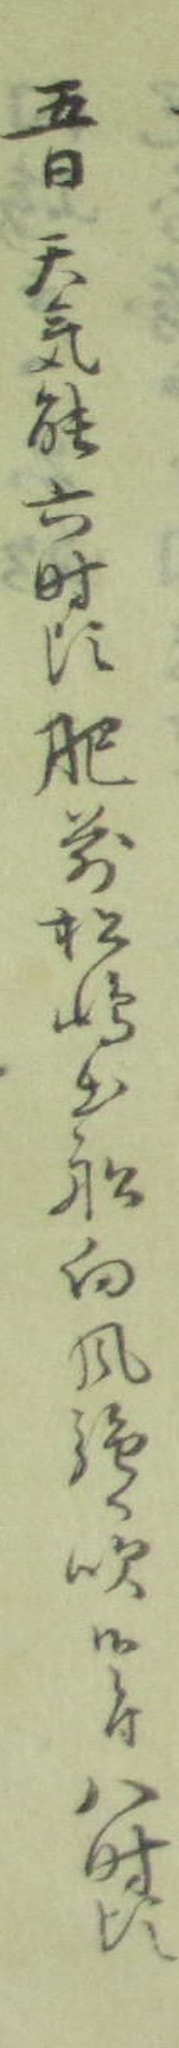五日天気能六時頃肥前松嶋出船向風強く吹候に付八時頃

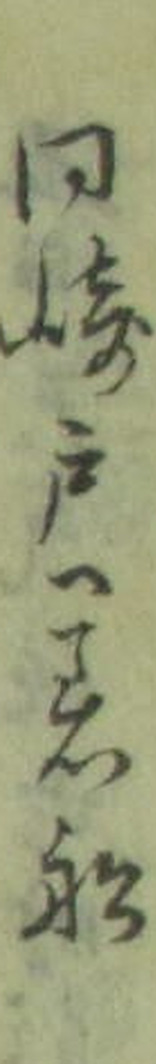同崎戸へ着船
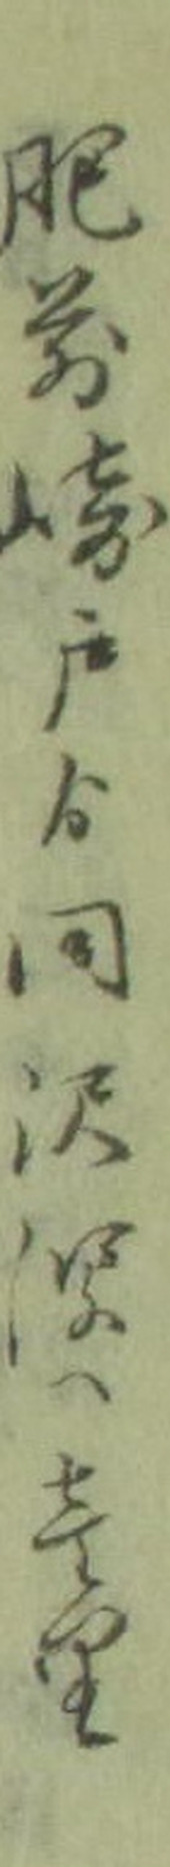肥前崎戸ゟ同沢潟へ壱里
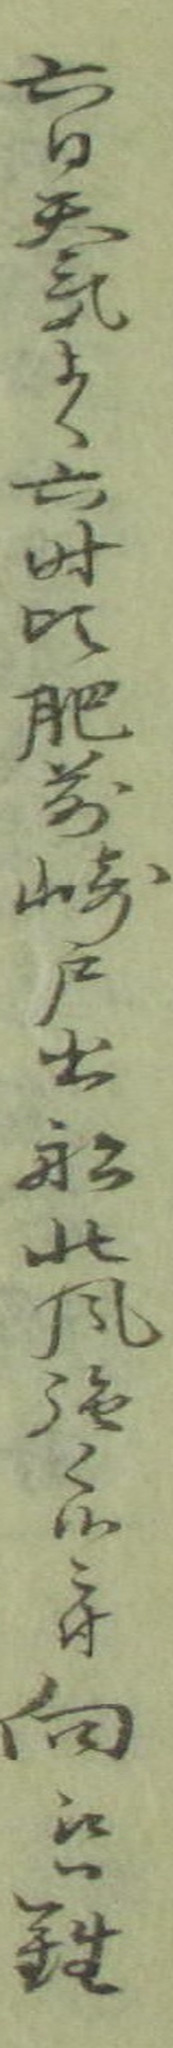六日天気よく六時頃肥前崎戸出船北風強く候に付向えは難
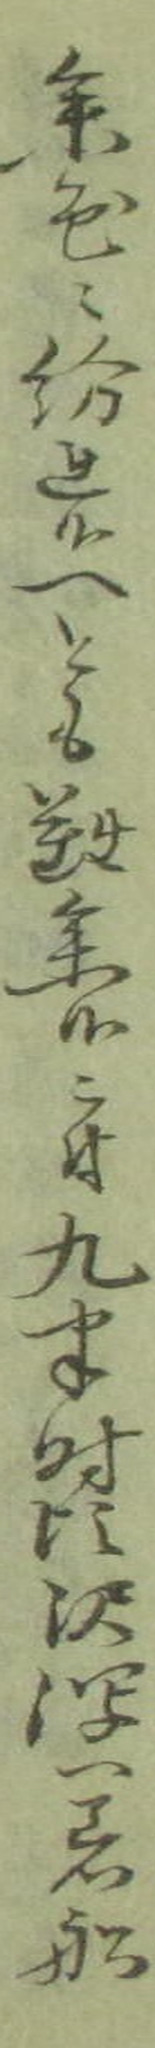参色々紛れ候へとも難参候に付九半時頃沢潟へ着船
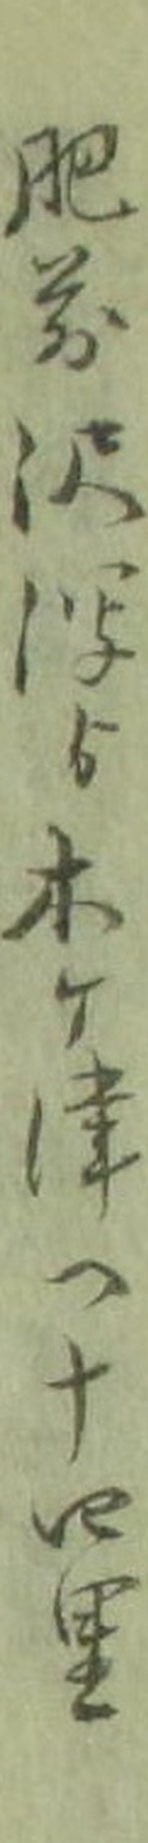肥前沢潟ゟ木ケ津へ十四里
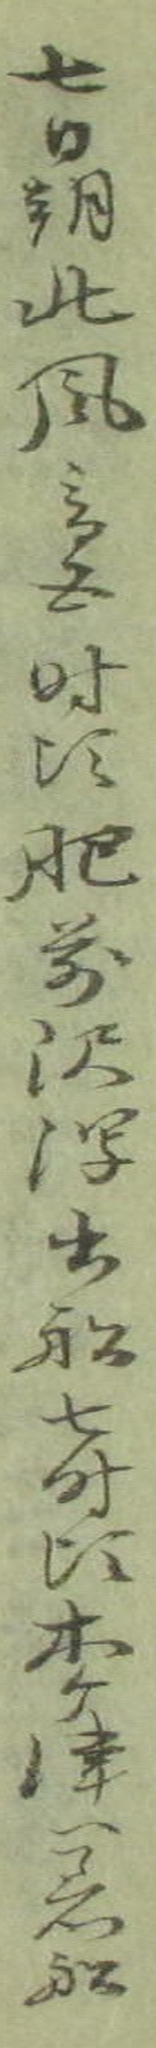七日朝北風にて五時頃肥前沢潟出船七時頃木ケ津へ着船
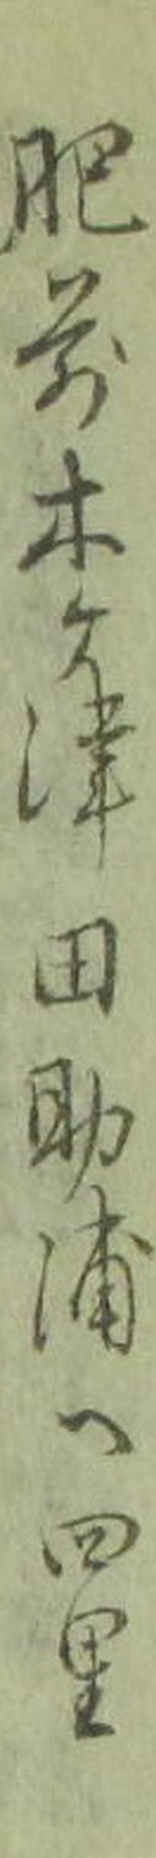肥前木ケ津田助浦へ四里
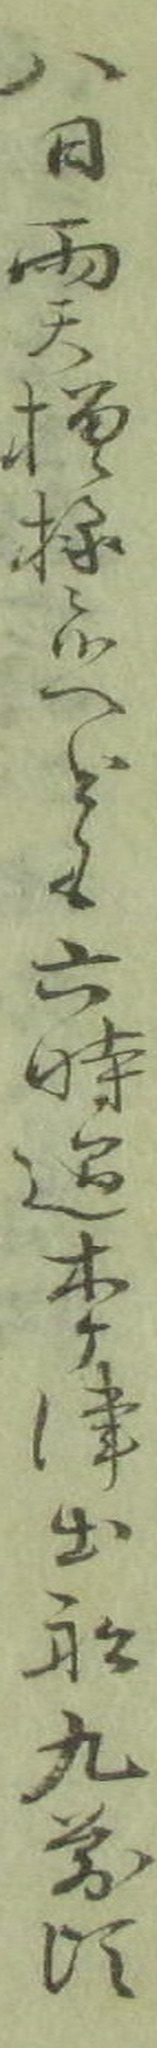八日雨天模様に候へども六時過木ケ津出船九前頃
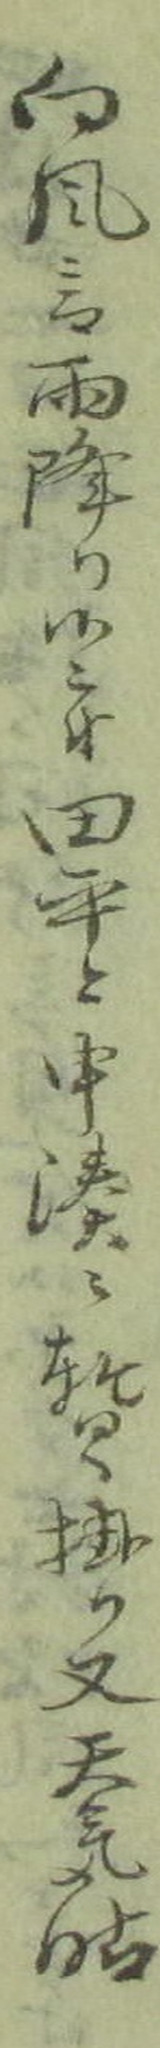向風にて雨降り候に付田平と申湊に暫く掛り又天気晴
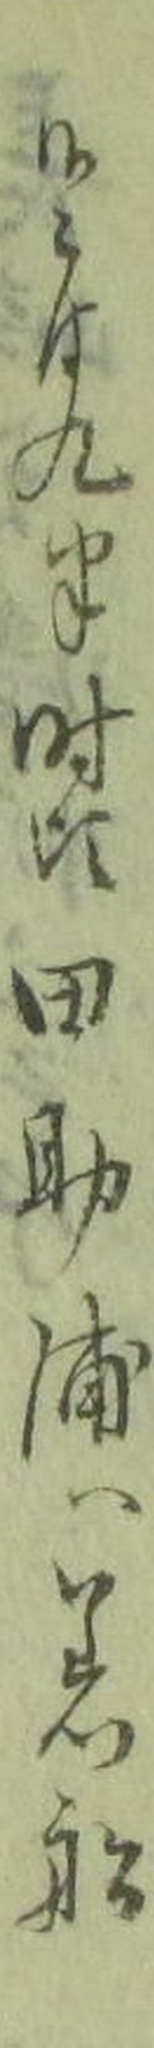候に付九半時頃田助浦へ着船
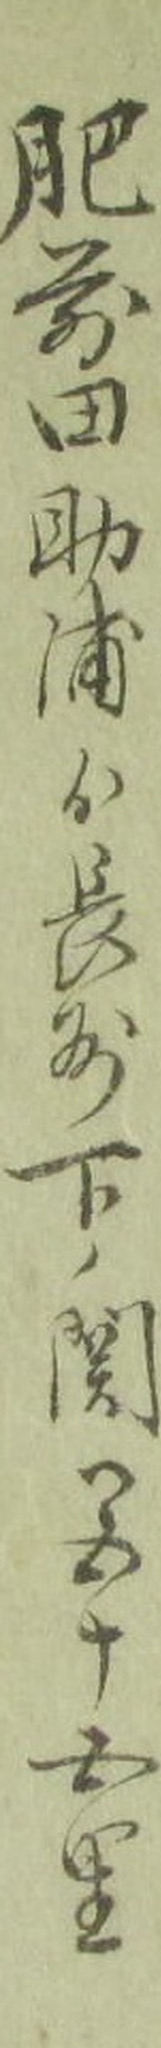肥前田助浦ゟ長州下ノ関へ五十五里
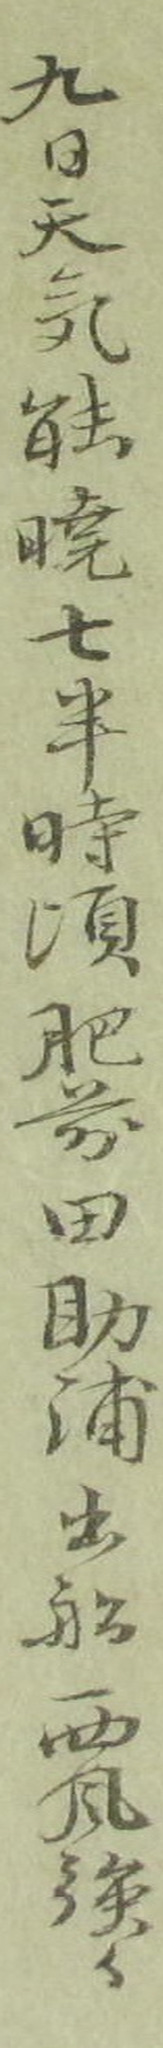九日天気能暁七半時頃肥前田助浦出船西風強く
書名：紀州九木浦庄屋記録 四
